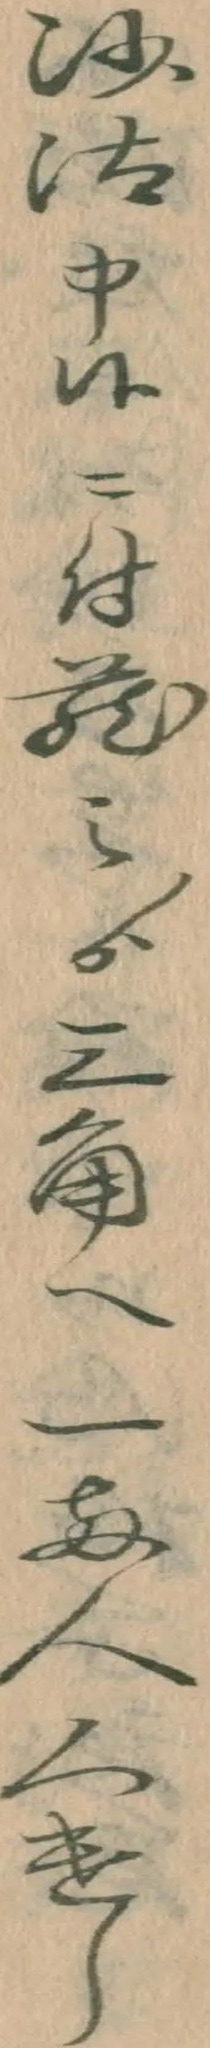沙汰申候に付蔵之ゟ三角へ一両人人遣し
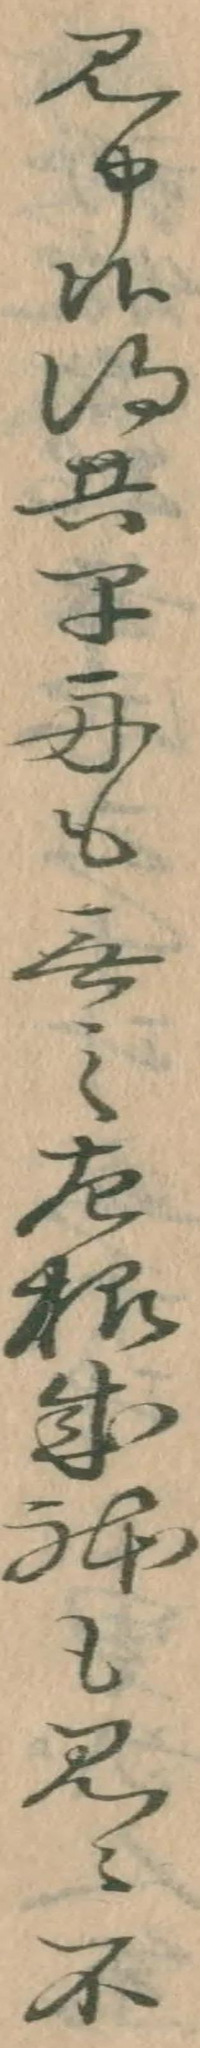見申候得共早舟も無之左様成躰も見に不
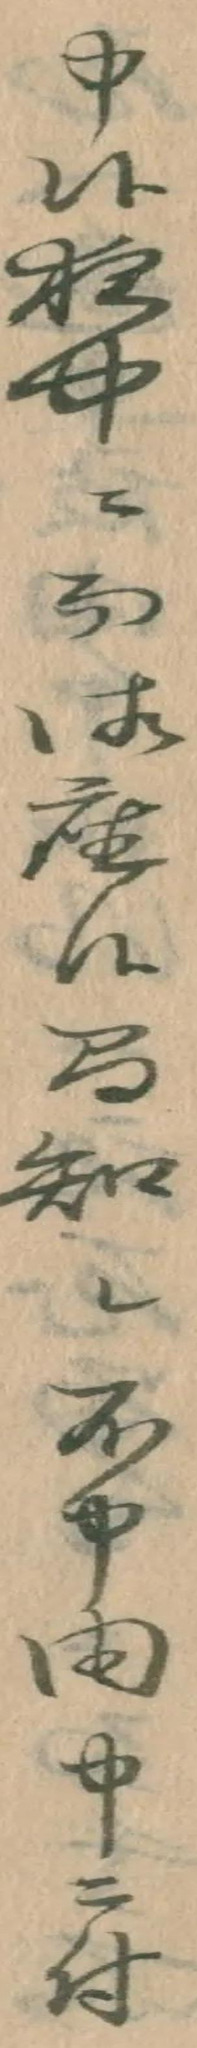申候夜中に而御座候間知れ不申由申に付
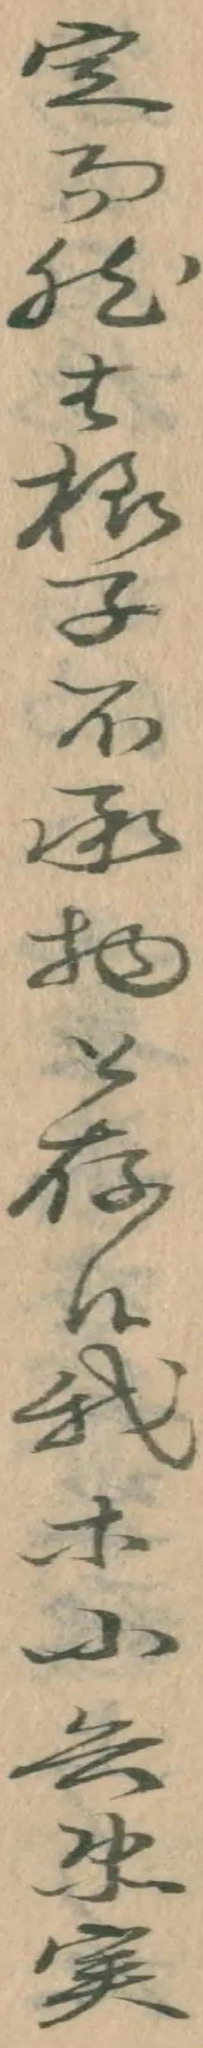定而然者様子不承物と存候我等小兵衛実
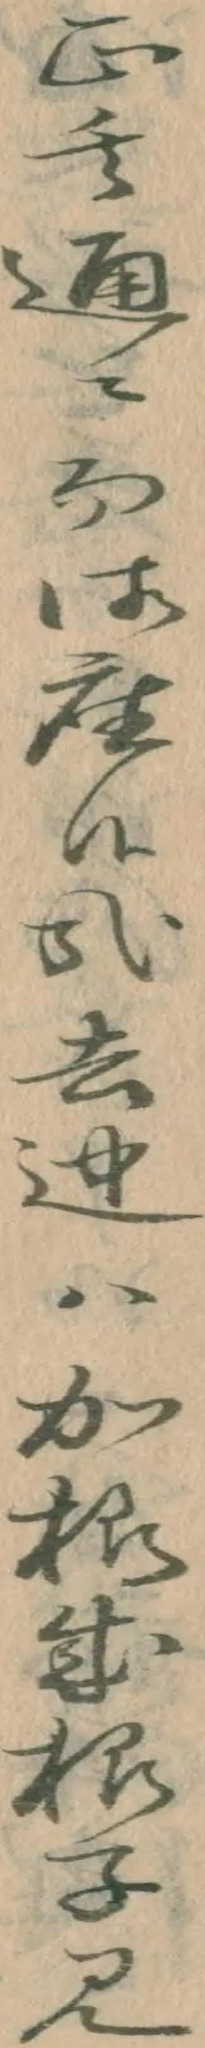正其通に而御座候哉去迚は加様成様子見
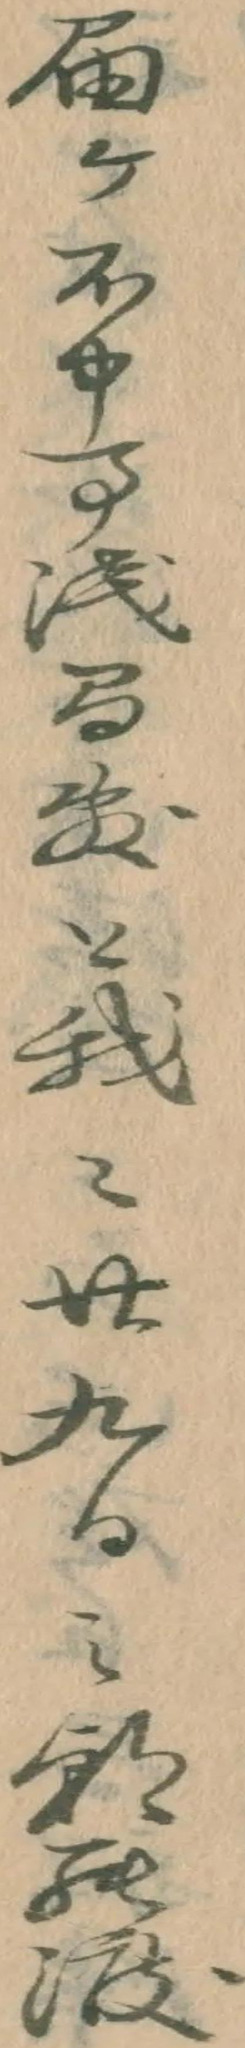届け不申事浅間敷と我々廿九日之朝罷渡
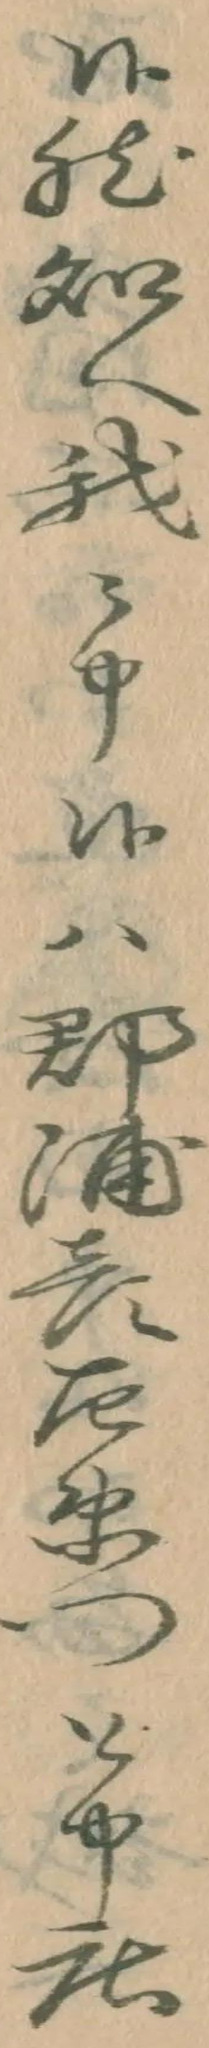候然処へ我ら申候は郡浦彦左衛門と申庄

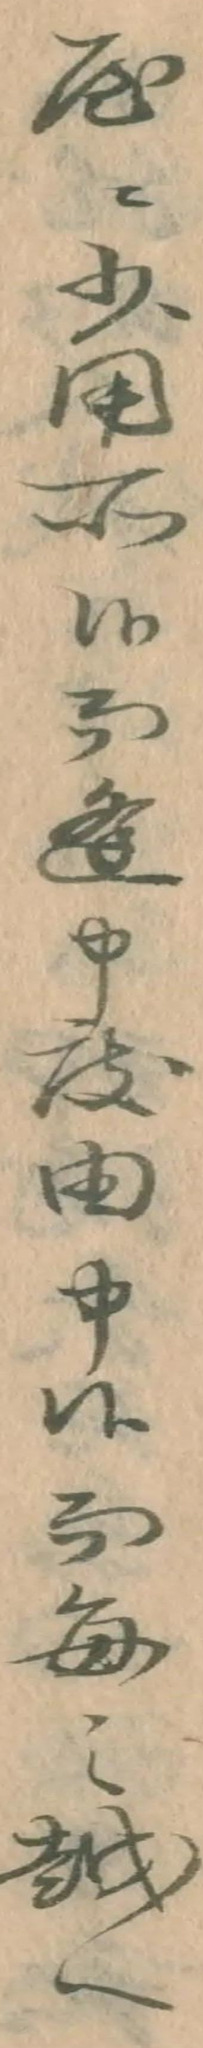屋に少用所候而逢申度由申候而毎之越へ
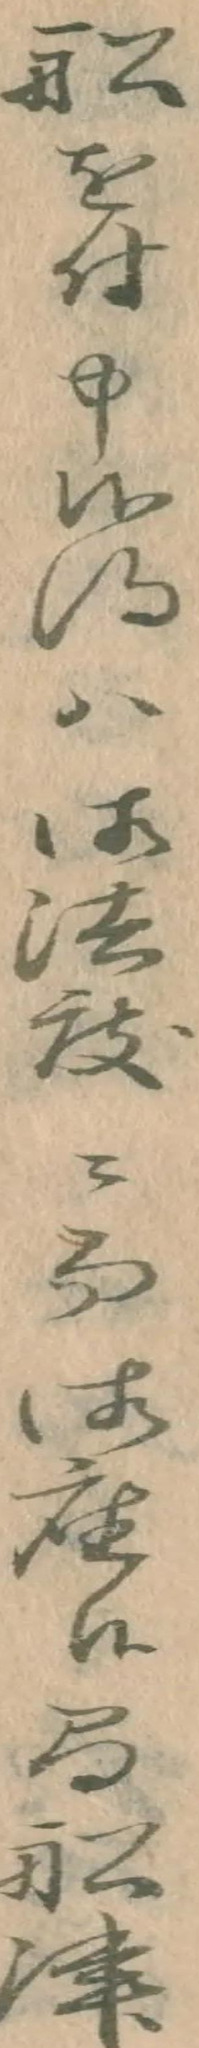舩を付申候得は御法度に而御座候間舩津
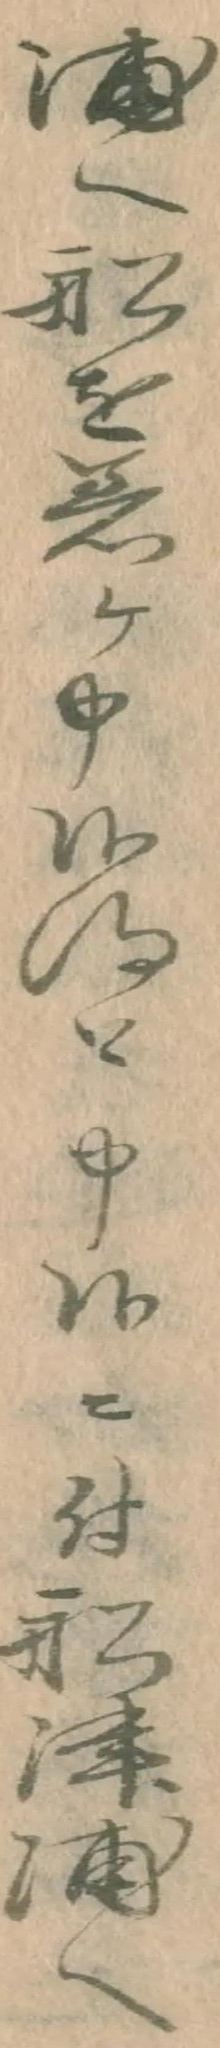浦へ舩を着け申候得と申候に付舩津浦へ
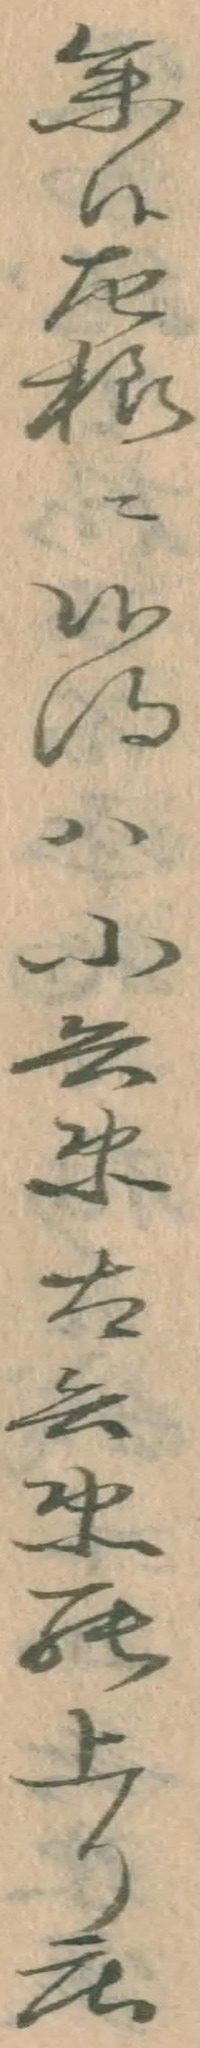参候左様に候得は小兵衛太兵衛罷上り庄
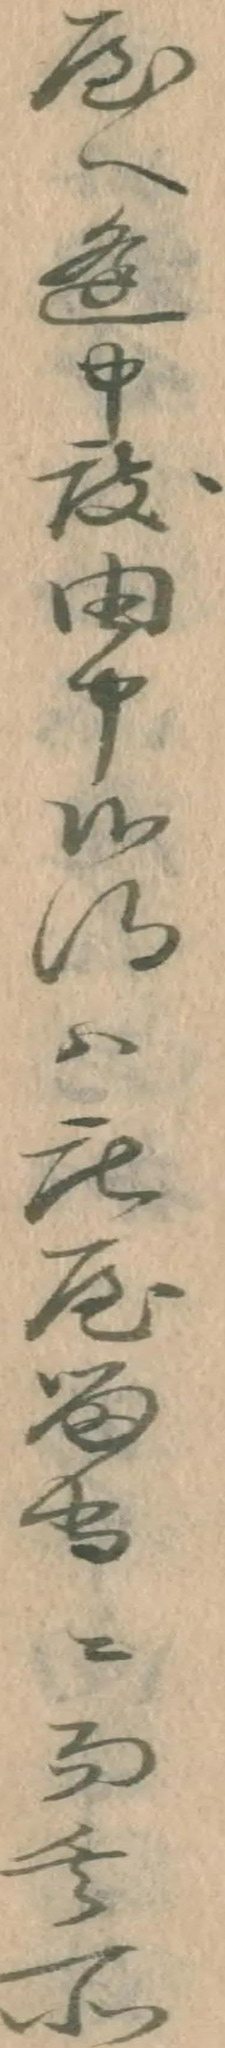屋へ逢申度由申候得は庄屋留守に而其所
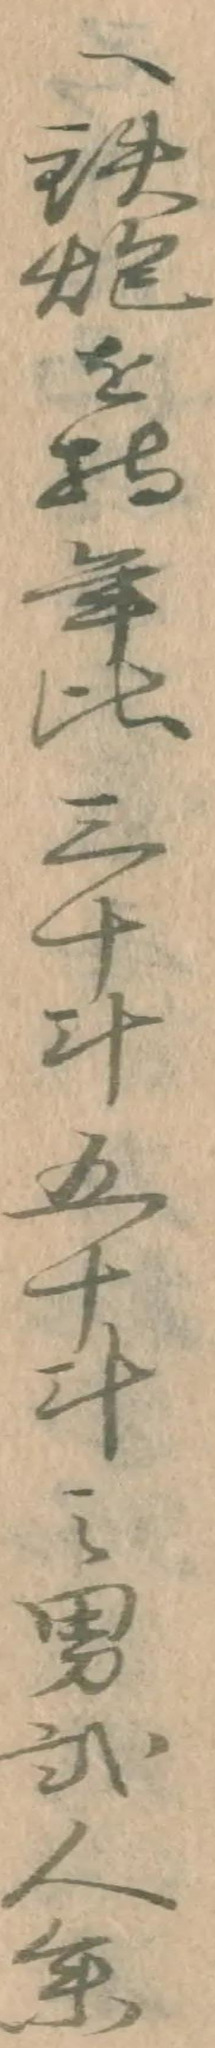へ鉄砲を持年比三十斗五十斗之男弐人参
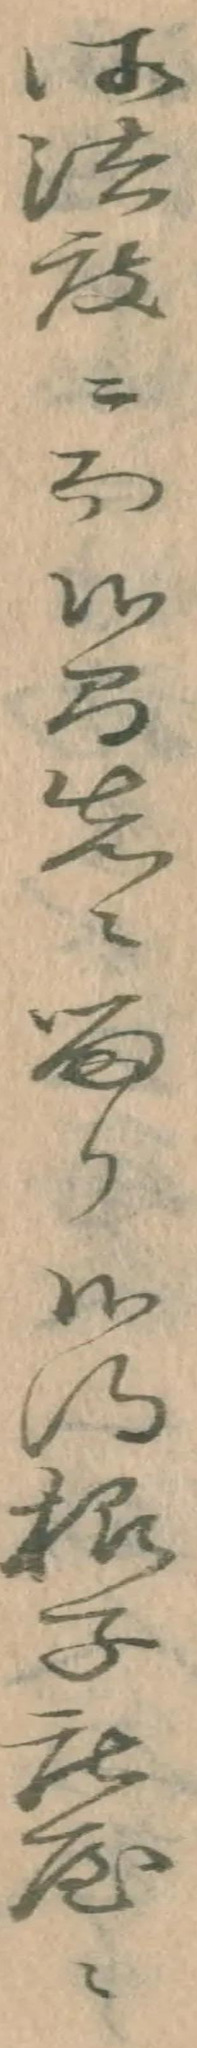御法度に而候間先に留り候得様子庄屋に
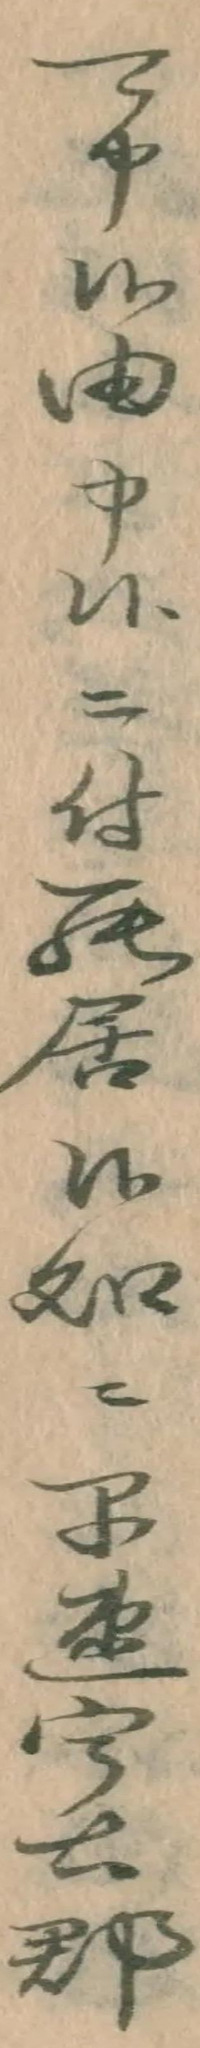可申候由申候に付罷居候処に早速宇土郡
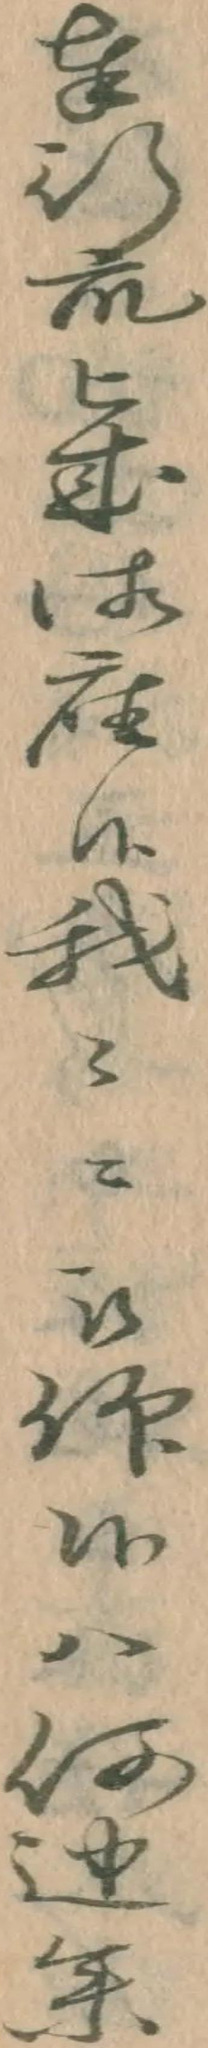奉行衆被成御座候我々に被仰候は何迚参
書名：切支丹御退治記 49巻. [6]
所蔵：国立国会図書館 National Diet Library, JAPAN
